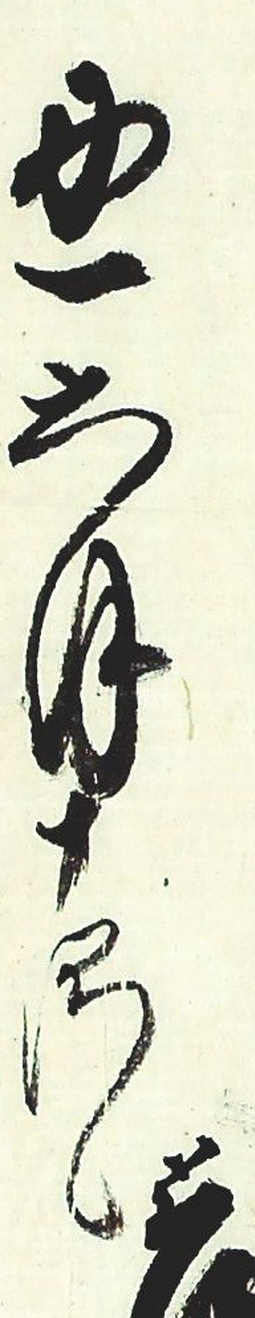丑六月十四日
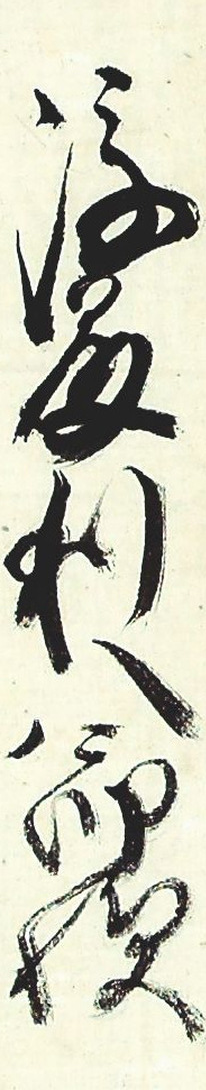後藤利八郎様
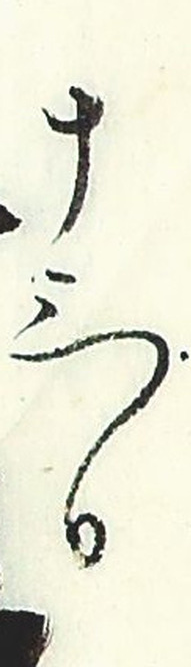十三日
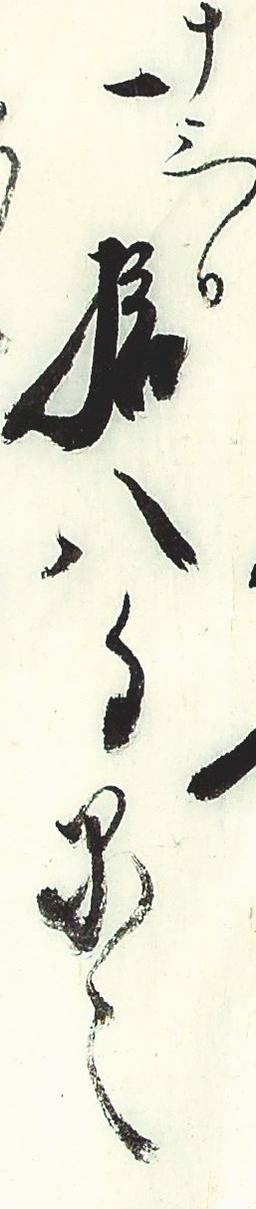一拾八匁品々
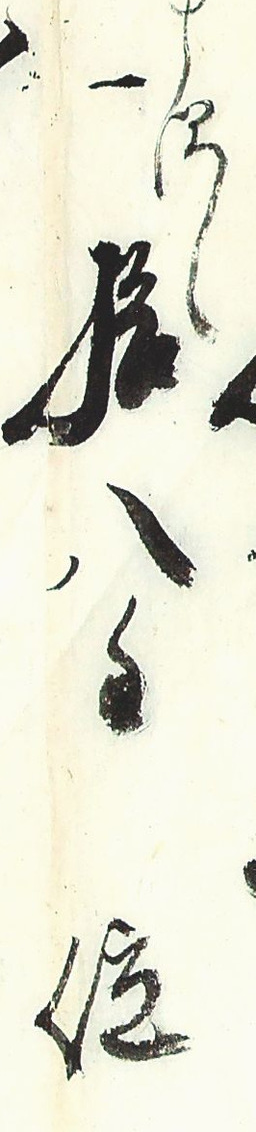一拾八匁位
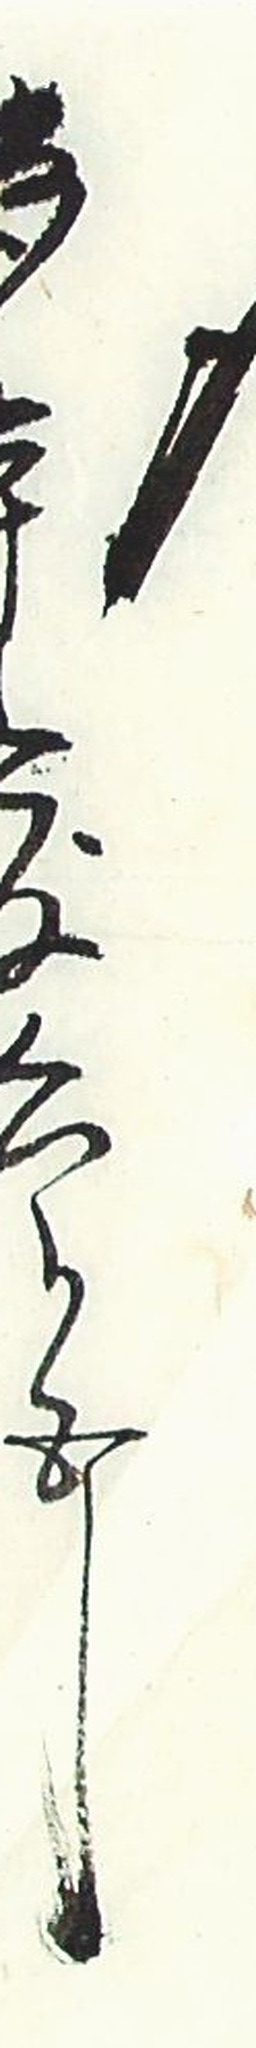惣〆六十六匁六分五厘
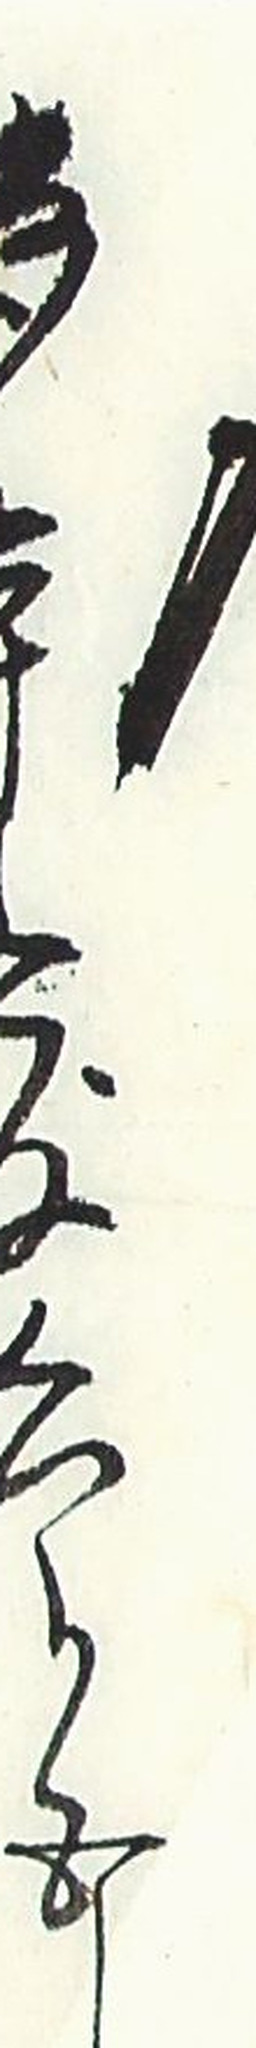惣〆六十六匁六分五厘

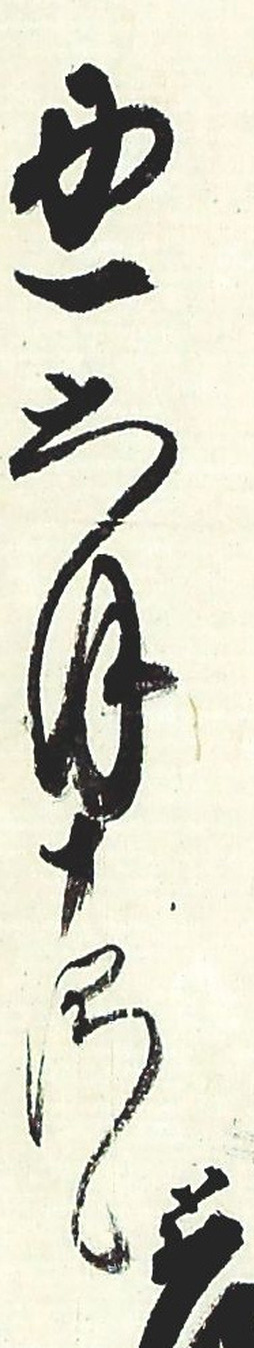丑六月十四日
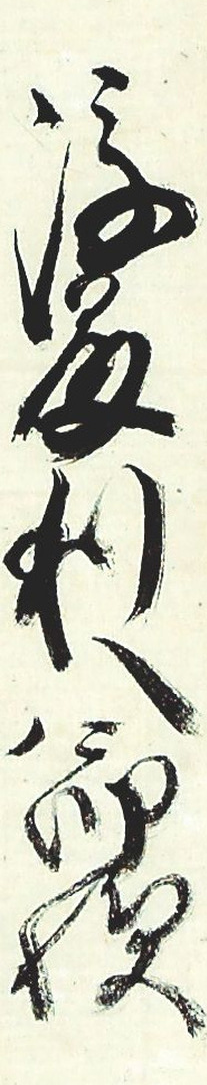後藤利八郎様
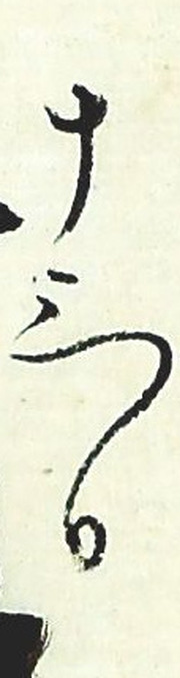十三日
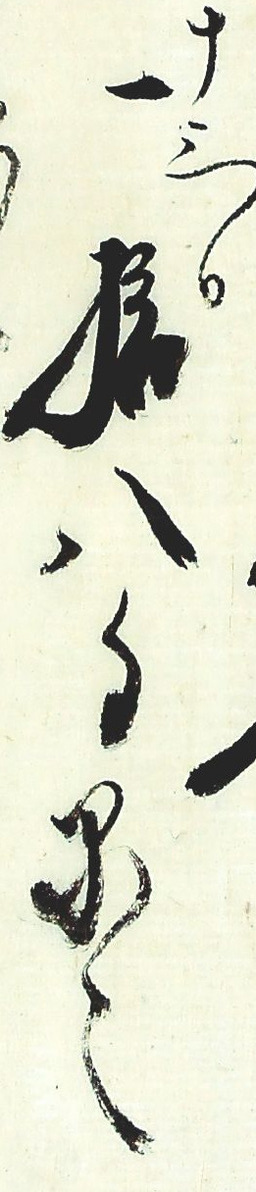一拾八匁品々
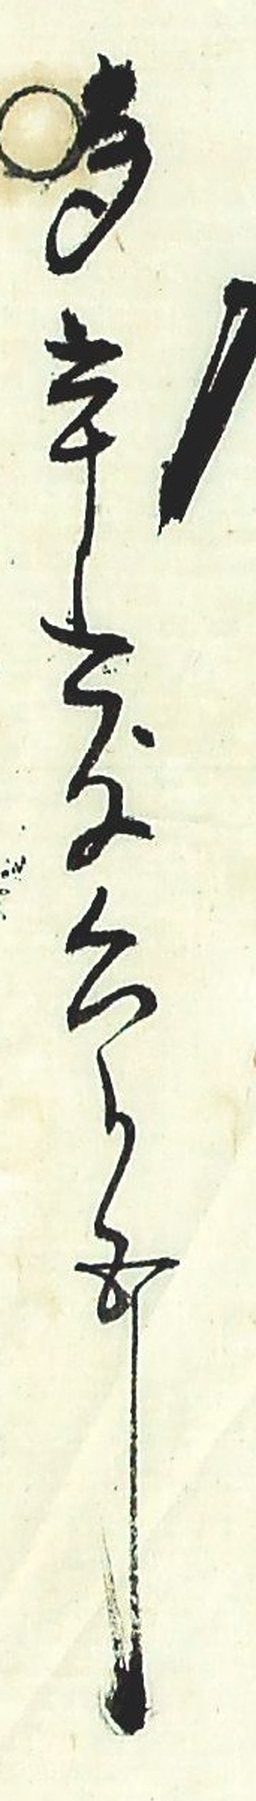惣〆六十六匁六分五厘
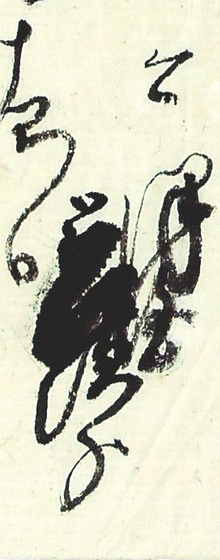十三日
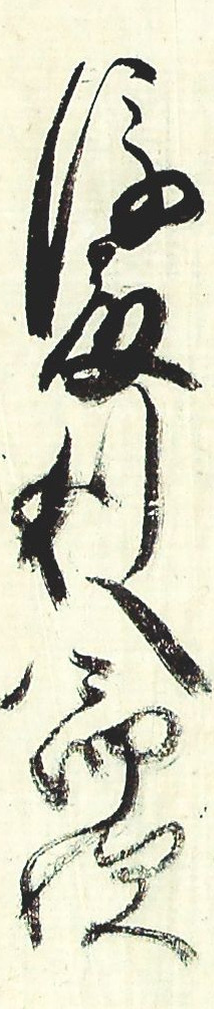後藤利八郎様

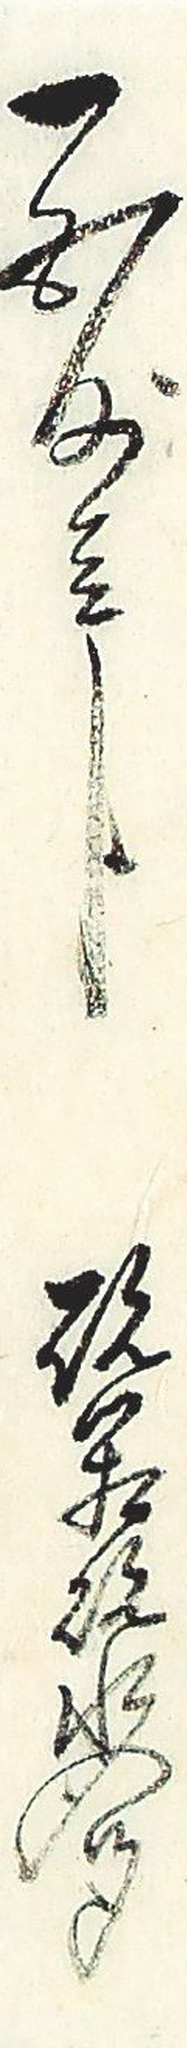一五匁壱分硯箱硯水合して
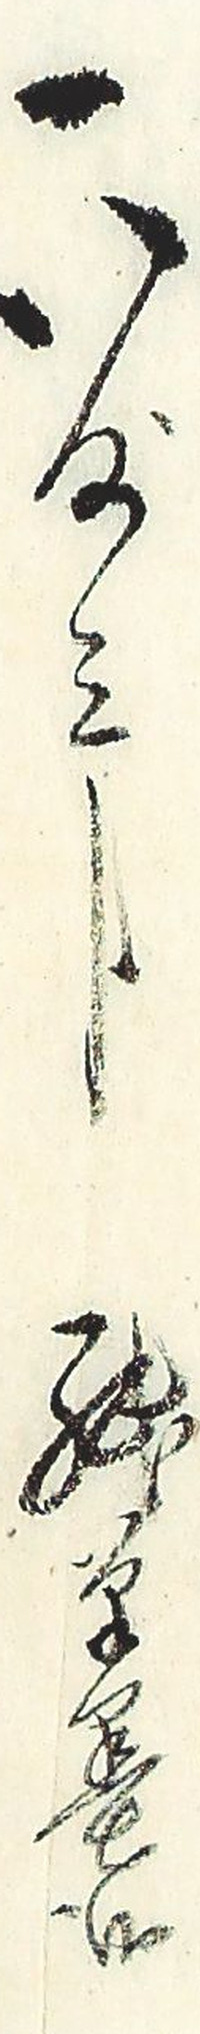一八匁三分紙筆墨代
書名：名東郡中諸割賦元帳
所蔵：鳴門教育大学 Naruto University of Education
